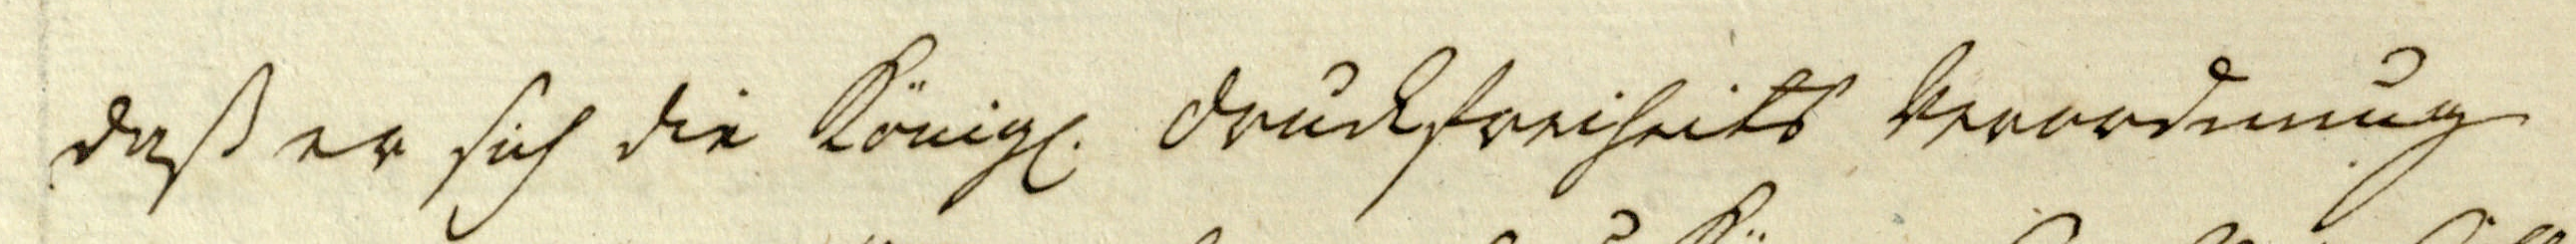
daß er sich die Königl. Druckfreiheits Verordnung
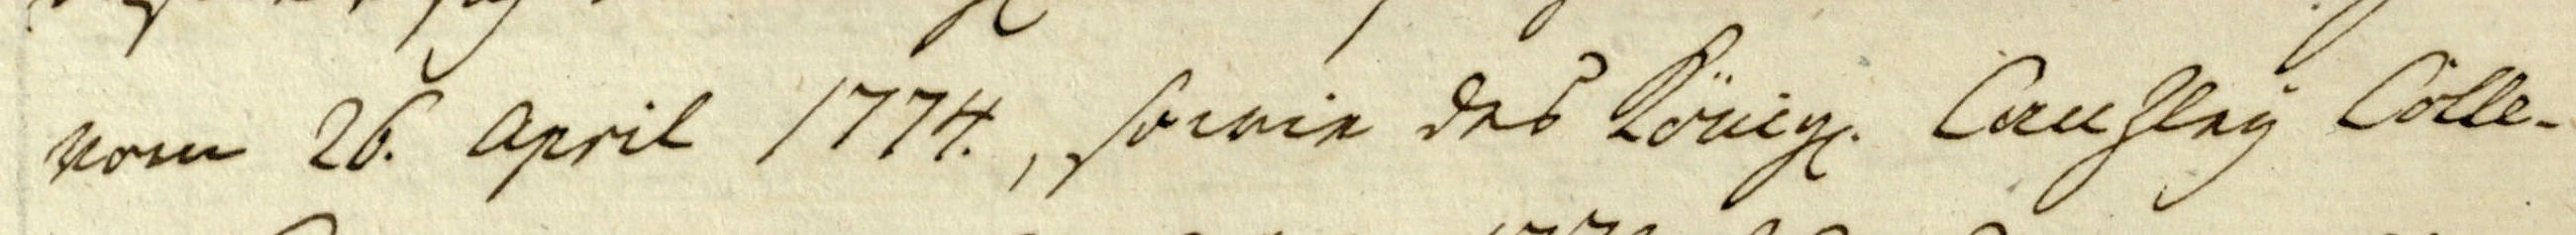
vom 26. April 1774., sowie des Königl. Canzleÿ Colle¬
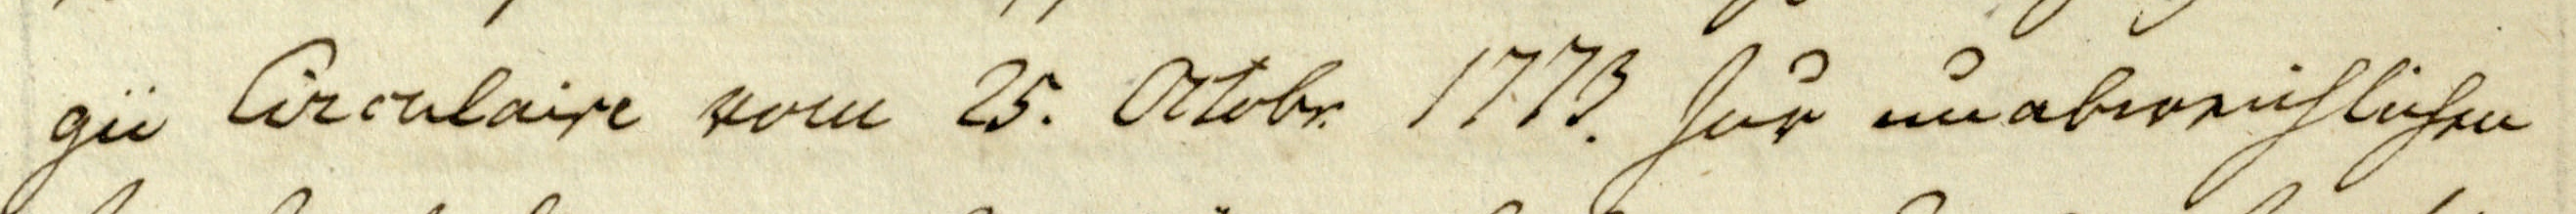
gii Circulaire vom 25. Octobr. 1773. zur unabweichlichen
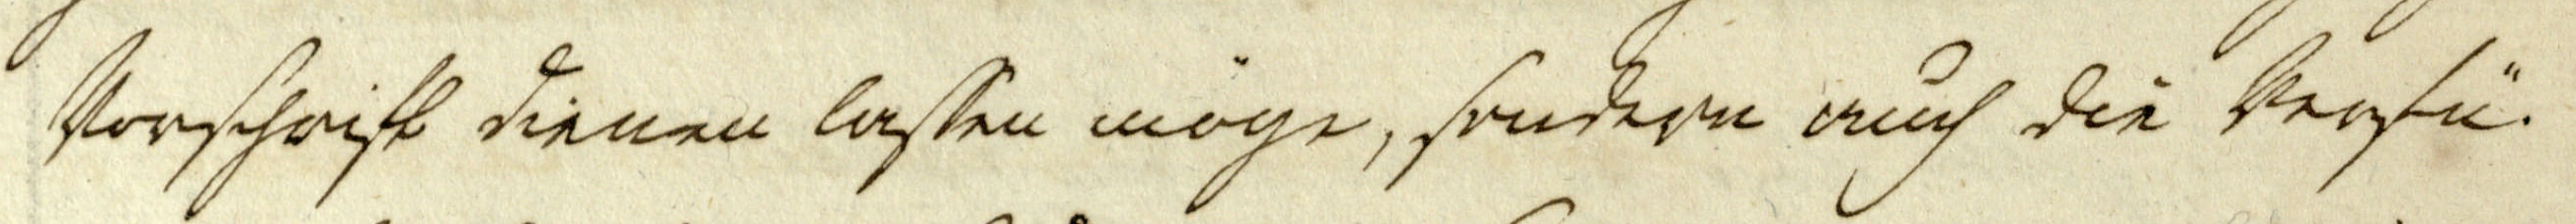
Vorschrift dienen lassen möge, sondern auch die Verfü¬
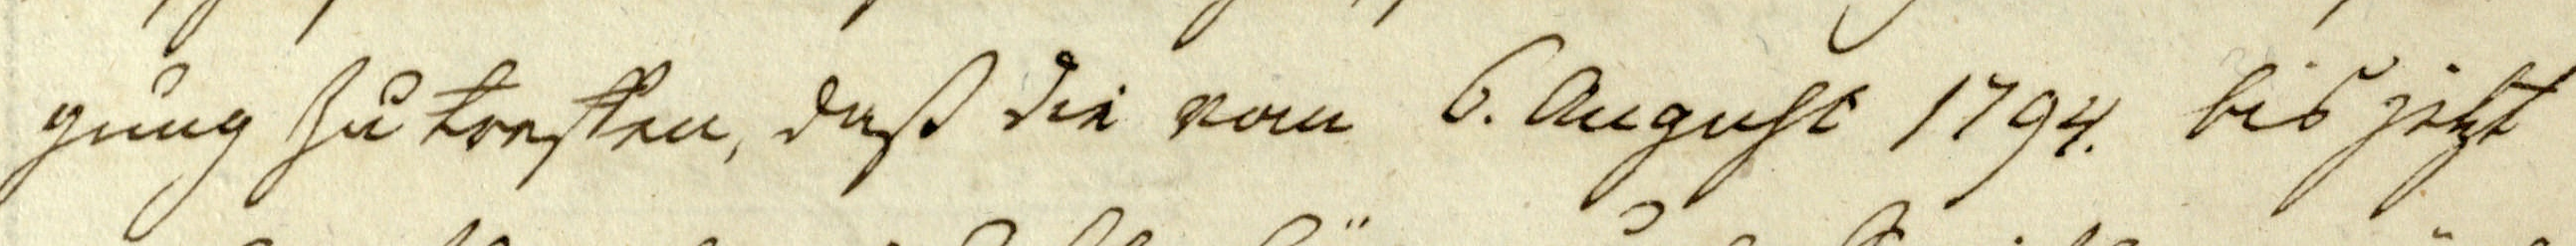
gung zu treffen, daß die vom 6. August 1794. bis jetzt
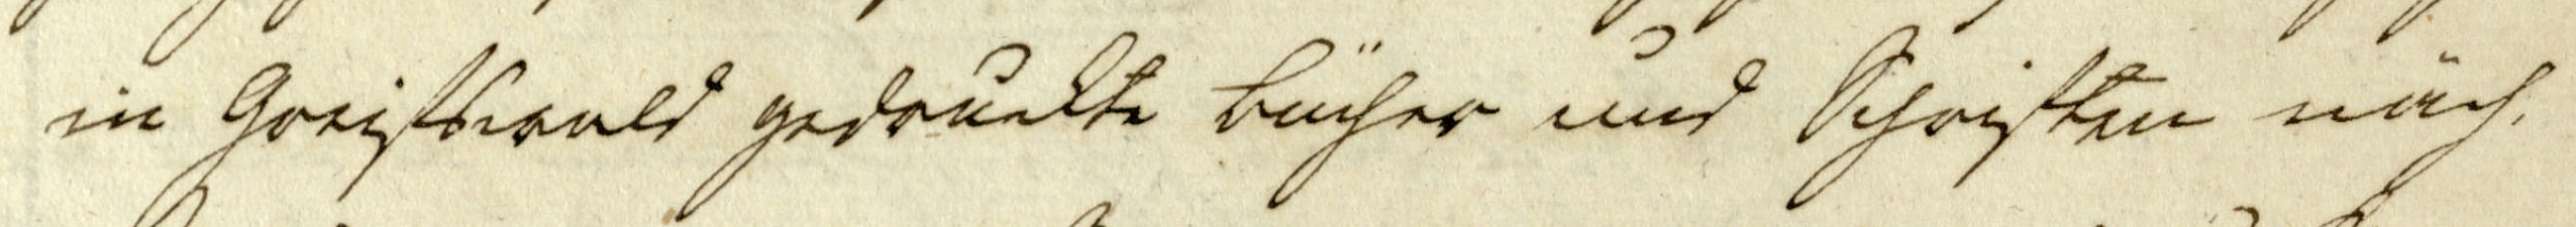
in Greifswald gedruckte Bücher und Schriften näch¬
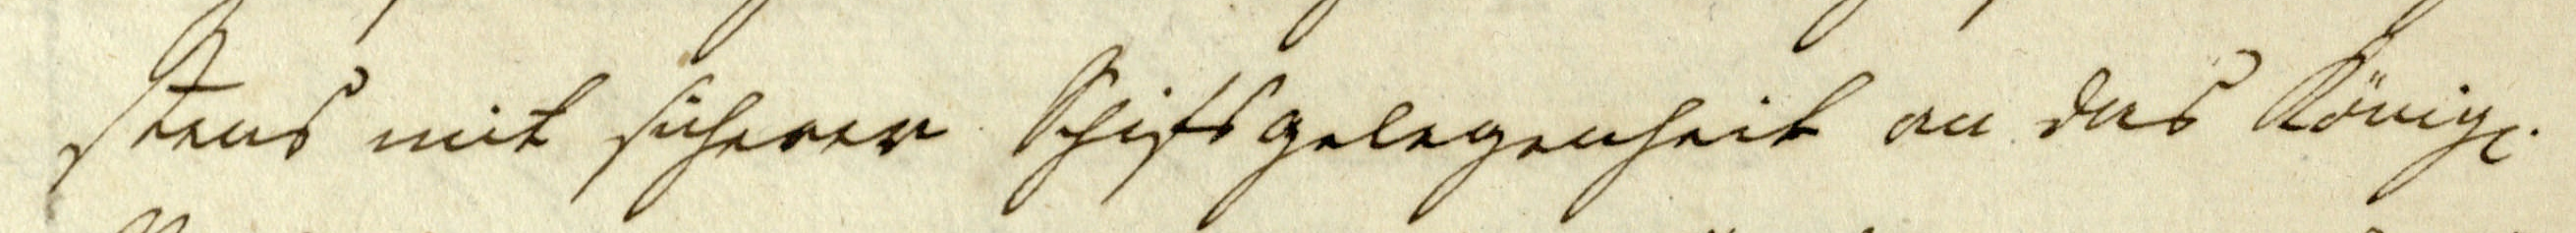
stens mit sicherer Schifsgelegenheit an das Königl.
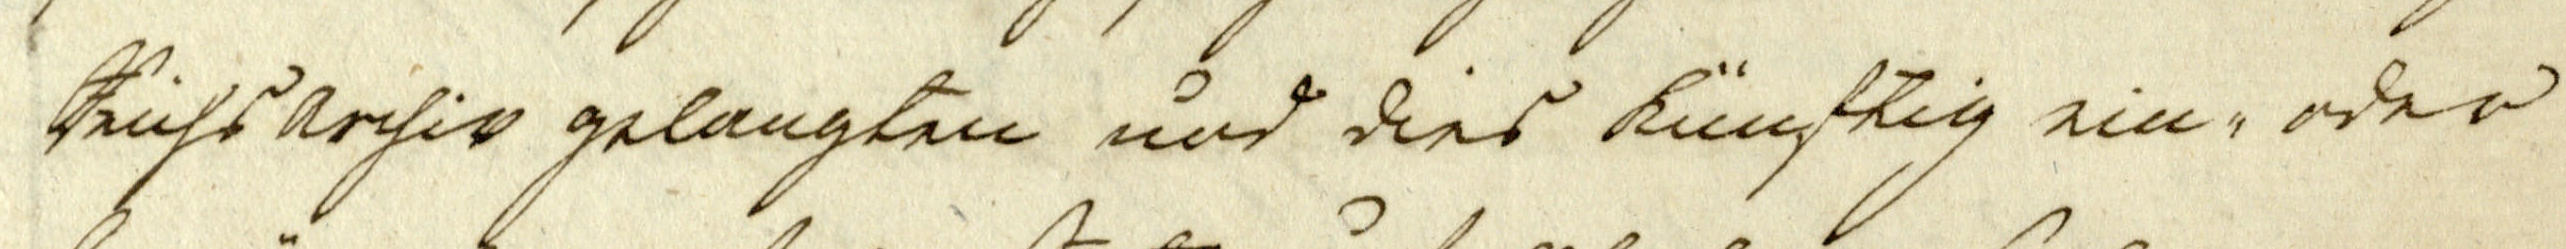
Reichs Archiv gelangten und dies künftig ein- oder
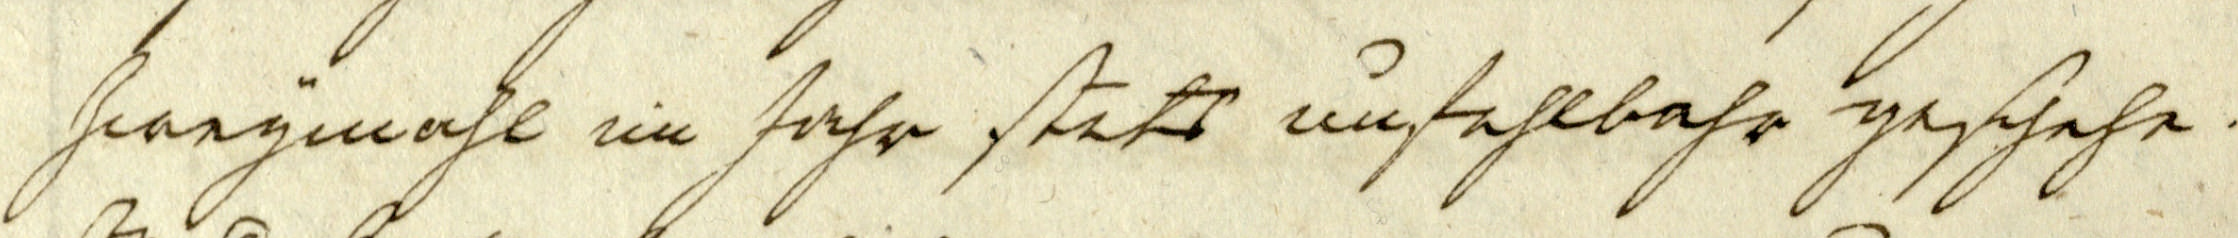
zweÿmahl im Jahr stets unfehlbahr geschehe.
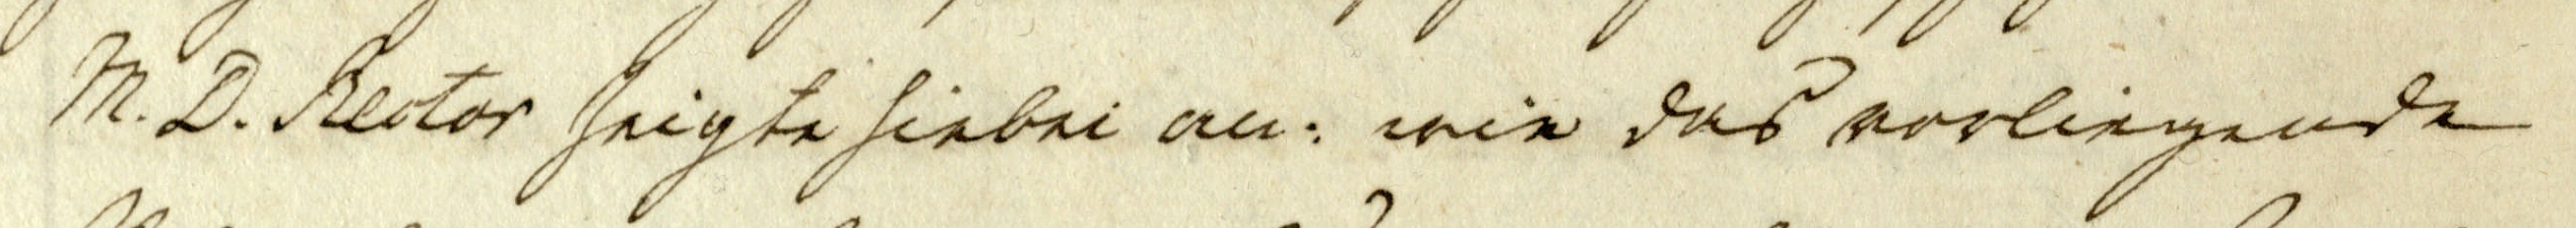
M. D. Rector zeigte hiebei an: wie das vorliegende
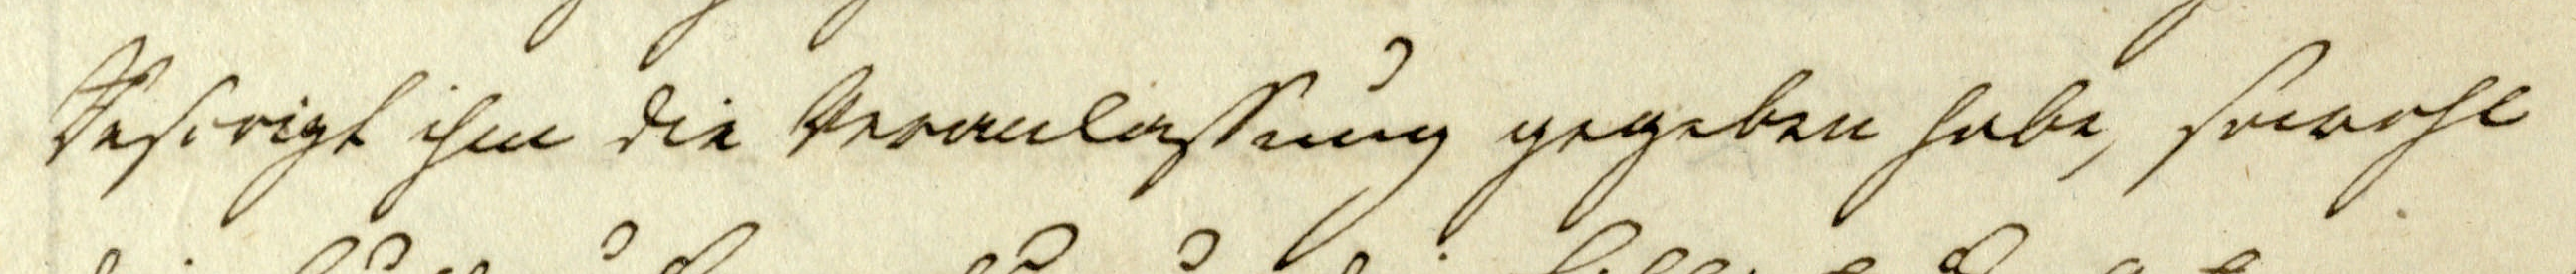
Rescript ihm die Veranlassung gegeben habe, sowohl
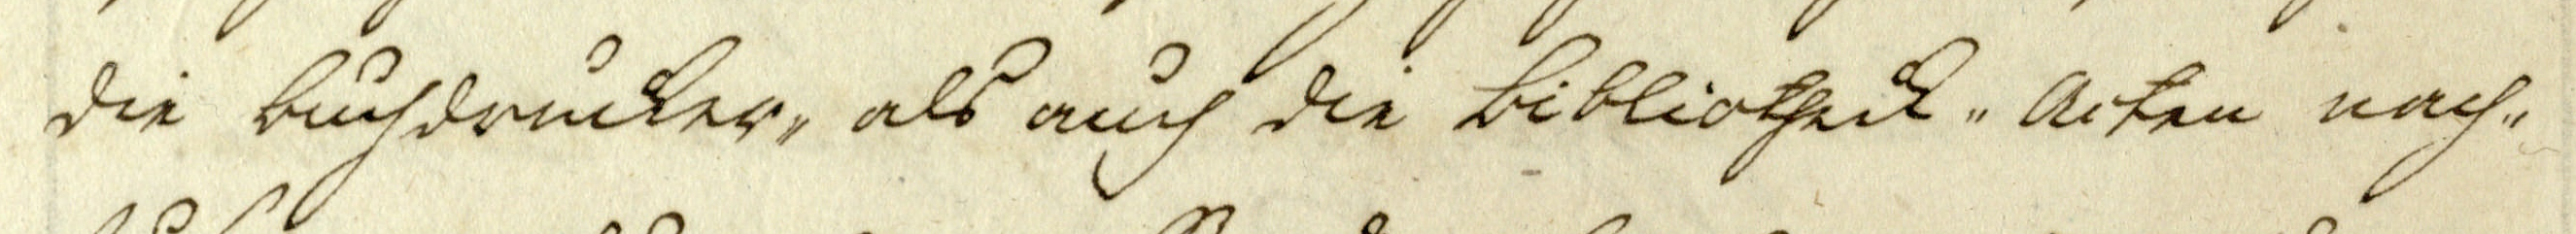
die Buchdrucker- als auch die Bibliotheck-Acten nach¬
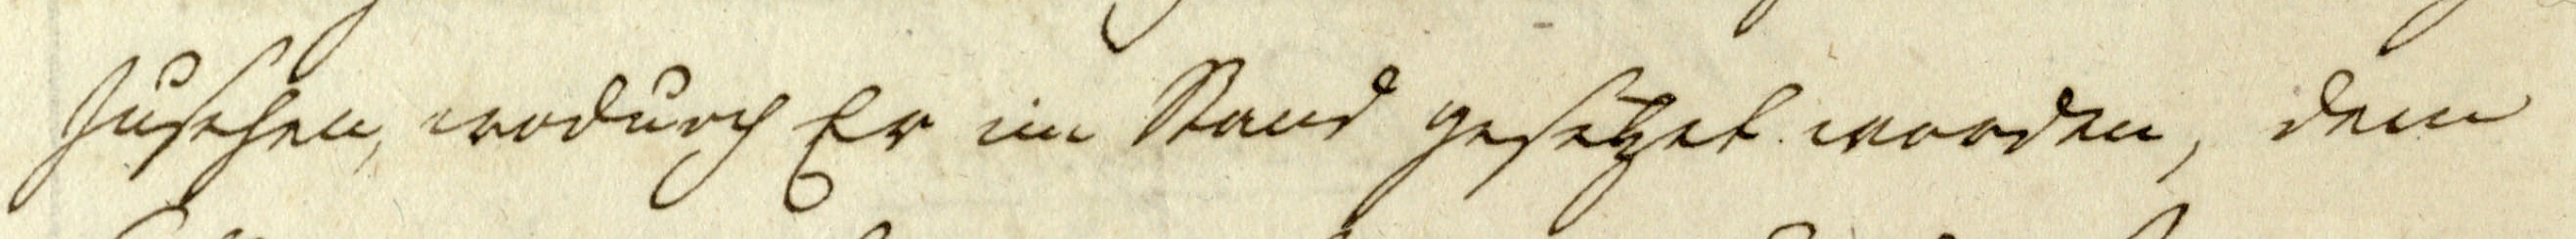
zusehen, wodurch Er im Stand gesetzet worden, dem
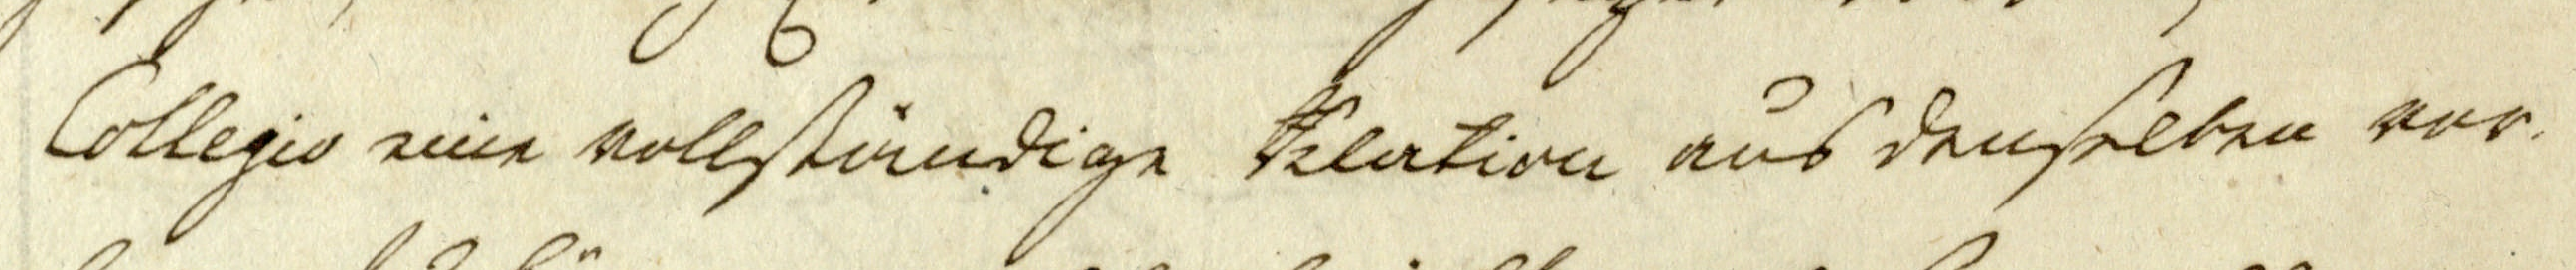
Collegio eine vollständige Relation aus denselben vor¬
